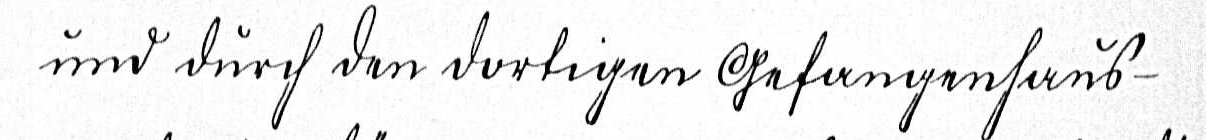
und durch den dortigen Gefangenhaus-
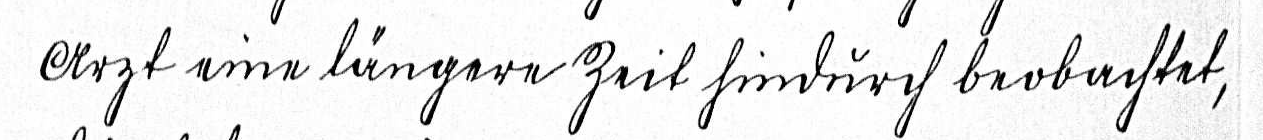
Arzt eine längere Zeit hindurch beobachtet,
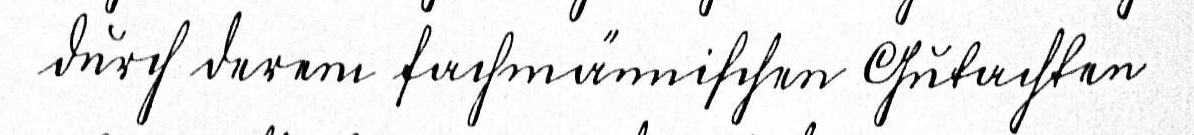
durch derem fachmännischen Gutachten
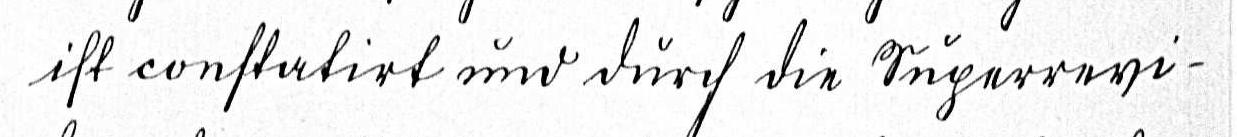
ist constatirt und durch die Superrevi¬
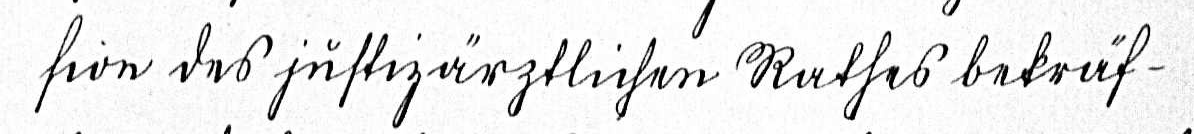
sion des justizärztlichen Rathes bekräf¬
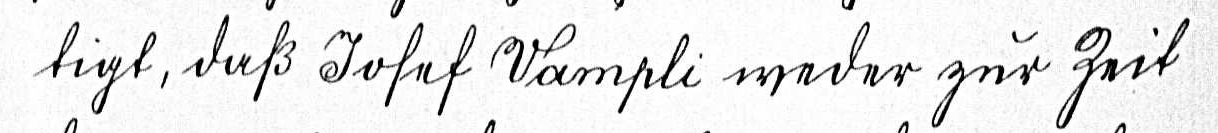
tigt, daß Josef Vampli weder zur Zeit
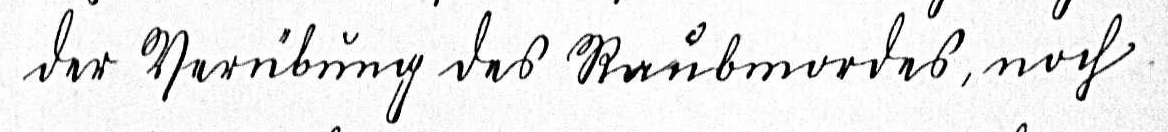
der Verübung des Raubmordes noch
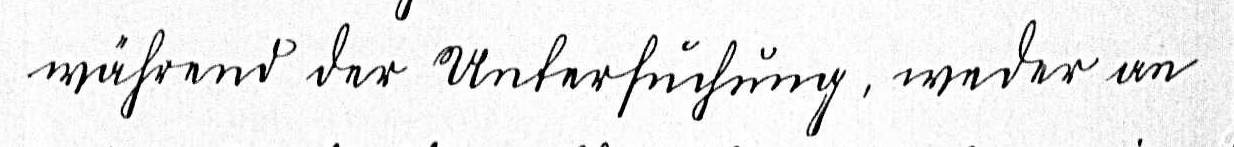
während der Untersuchug, weder an
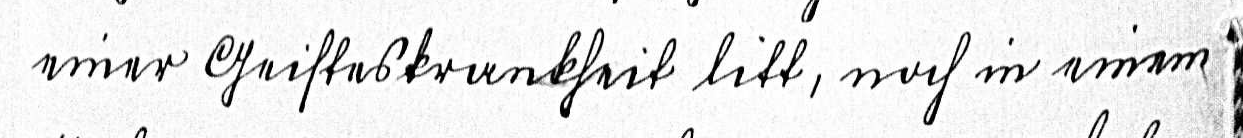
einer Geisteskrankheit litt, noch in einem
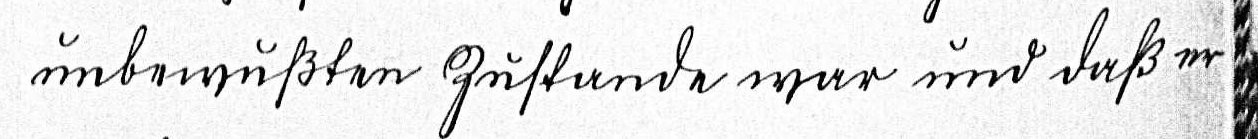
unbewußten Zustande war und daß er
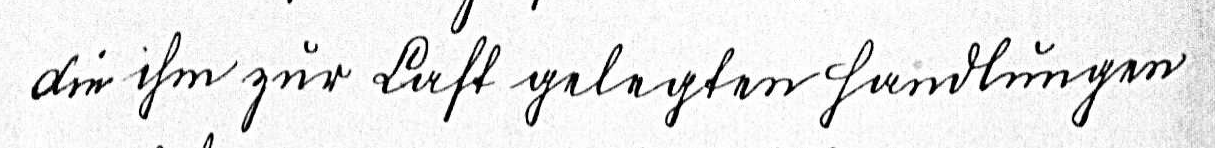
die ihm zur Last gelegten Handlungen
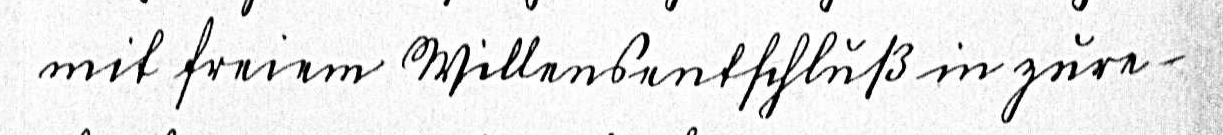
mit freiem Willensentschluß in zure¬
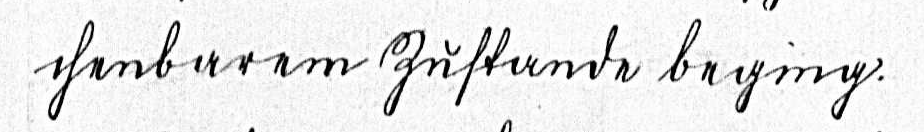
chenbarem Zustande beging.
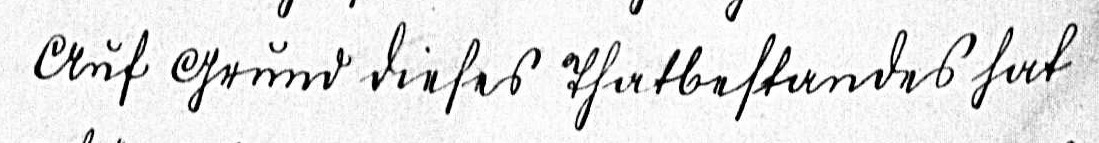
Auf Grund dieses Thatbestandes hat
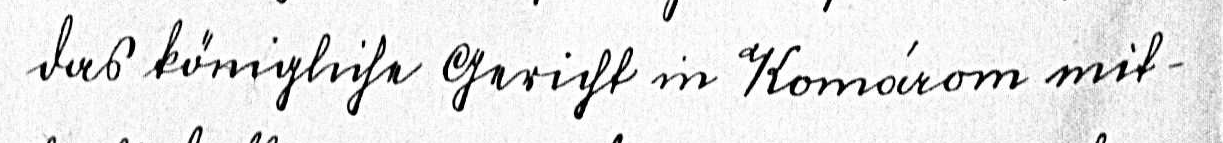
das königliche Gericht in Komárom mit¬
